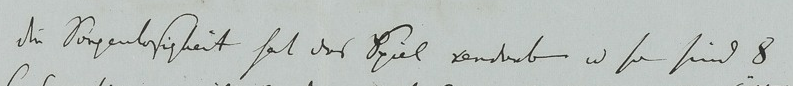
die Sorgenlosigkeit hat das Spiel verdorbenu so sind 8
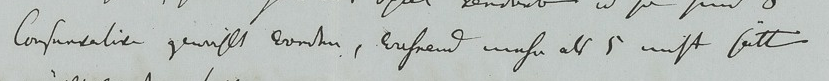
Conservative gwählt worden, wahrend mehr als 5 nicht hätten
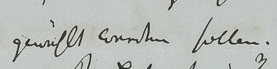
gewählt werden sollen.
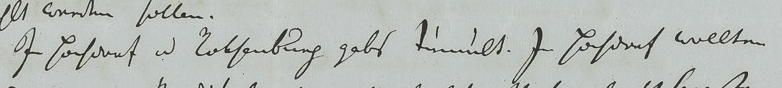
In Hochdorf u Rothenburg gabs Tumult. In Hochdorf wollten
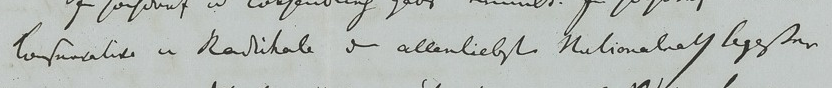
Conservative u Radikale den allerliebsten Nationalrath Segeßer
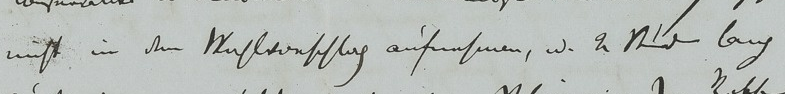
nicht in den Wahlvorschlag aufnehmen, u. 2 Stunden lang
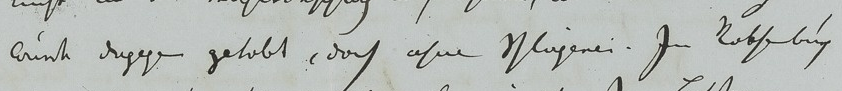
wurde dagegen getobt, doch ohne Schlägerei. In Rothenburg
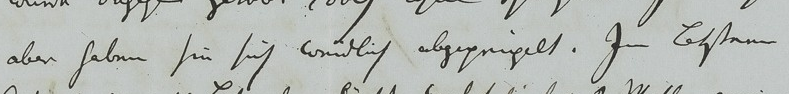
aber haben sie sich weidlich abgeprügelt. Im letztern
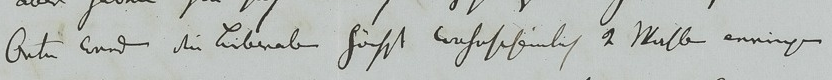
Orte werden die Liberalen höchst wahrscheinlich 2 Wahlen erringen
